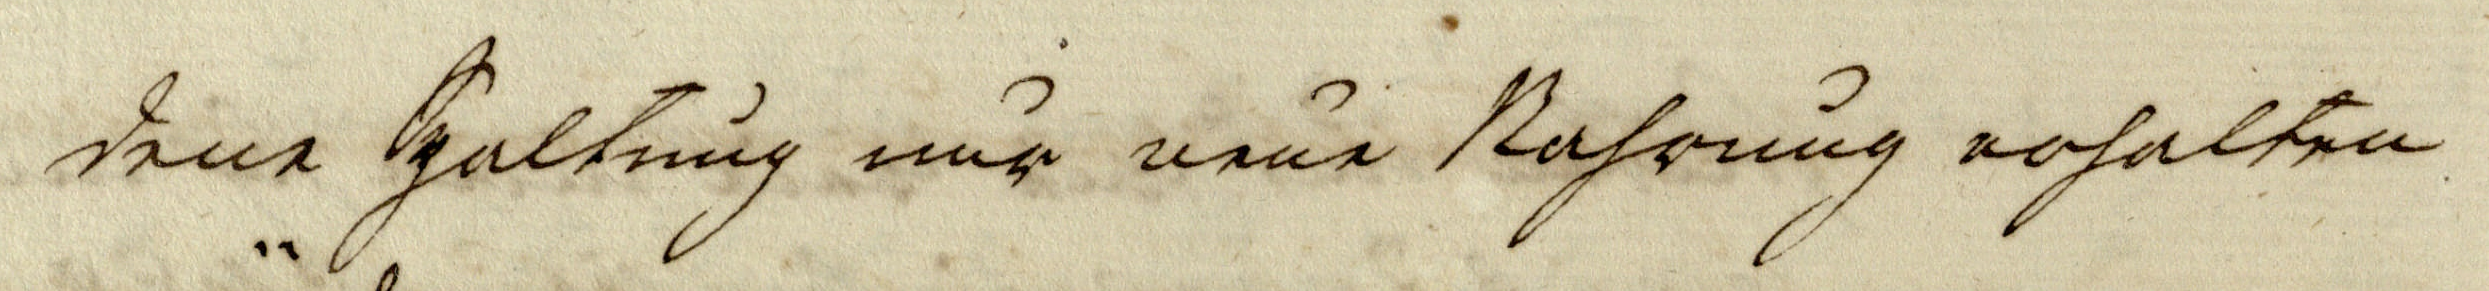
dene Spaltung nur neue Nahrung erhalten
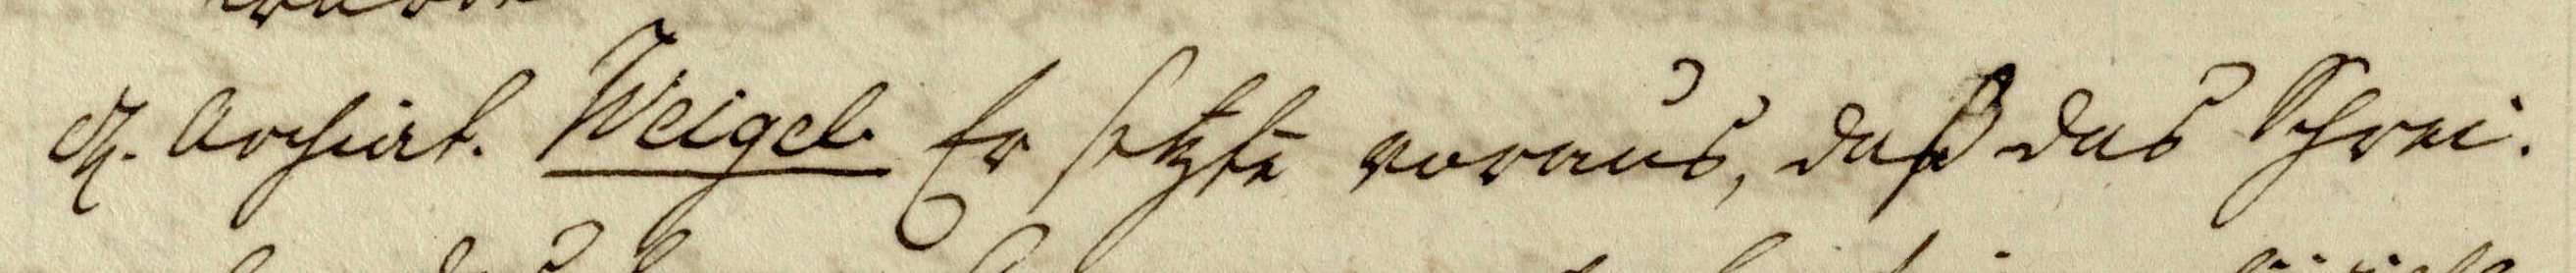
dh. Archiat. Weigel. Er setzte voraus, daß das Schrei¬
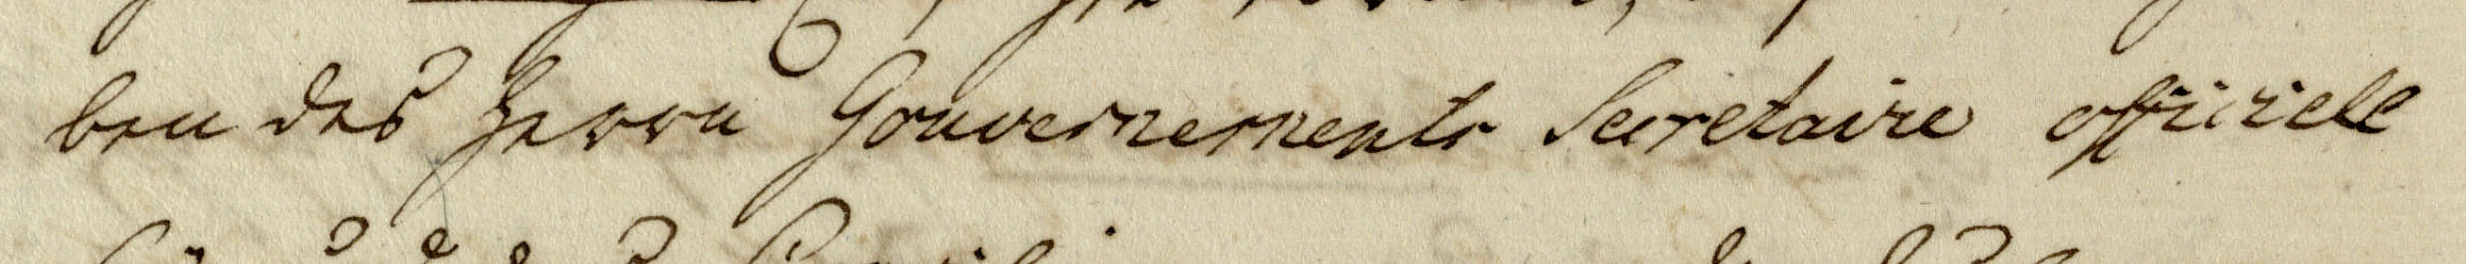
ben des Herrn Gouvernements Secretaire officiell
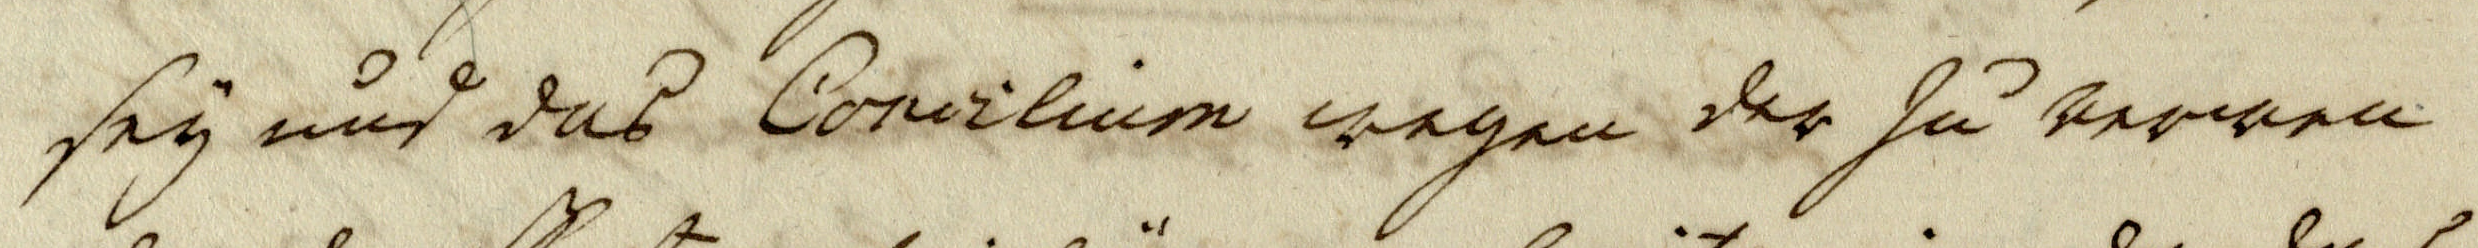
seÿ und das Concilium wegen der zu verwen¬
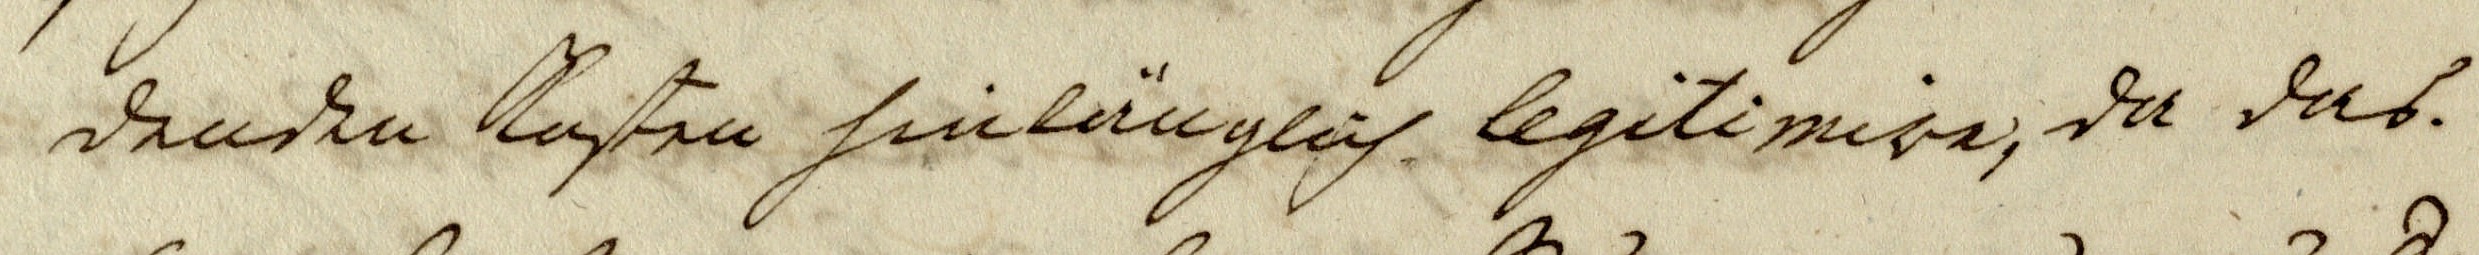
denden Kosten hinlänglich. legitimire, da das¬
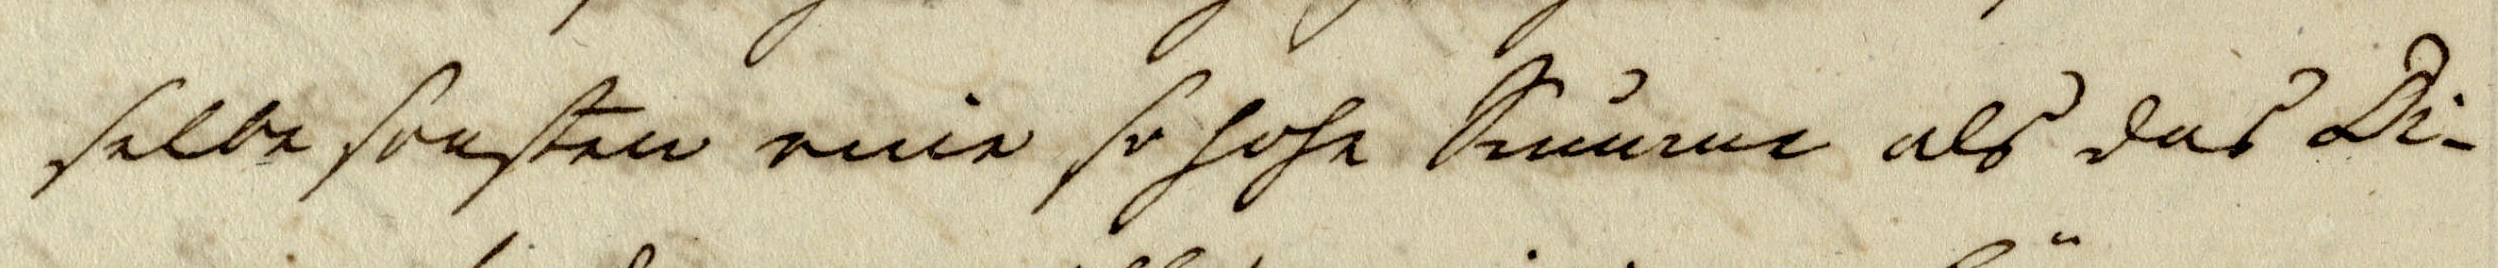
selbe sonsten eine so hohe Summe als das Di
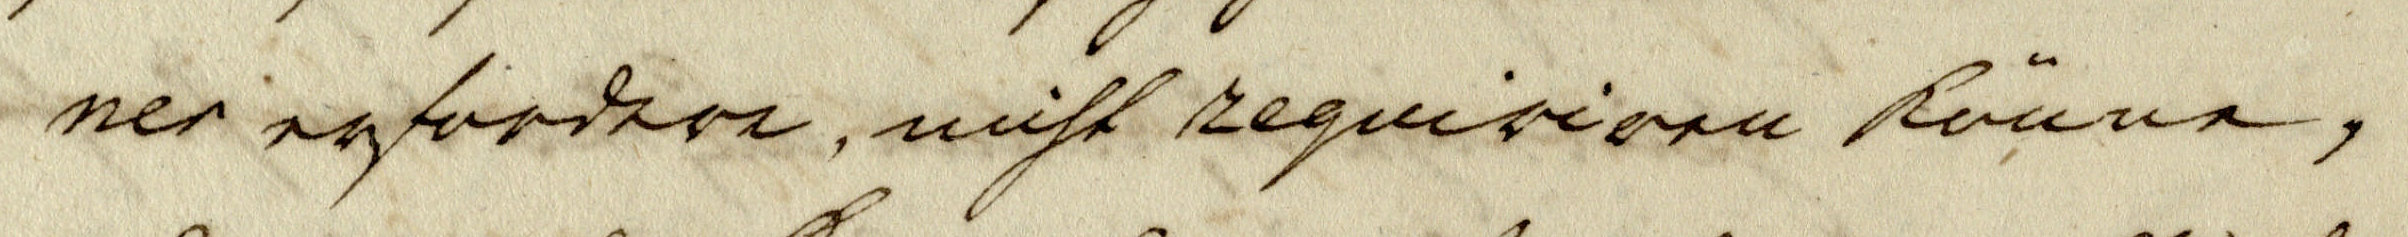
ner erfordere, nicht requiriren könne,
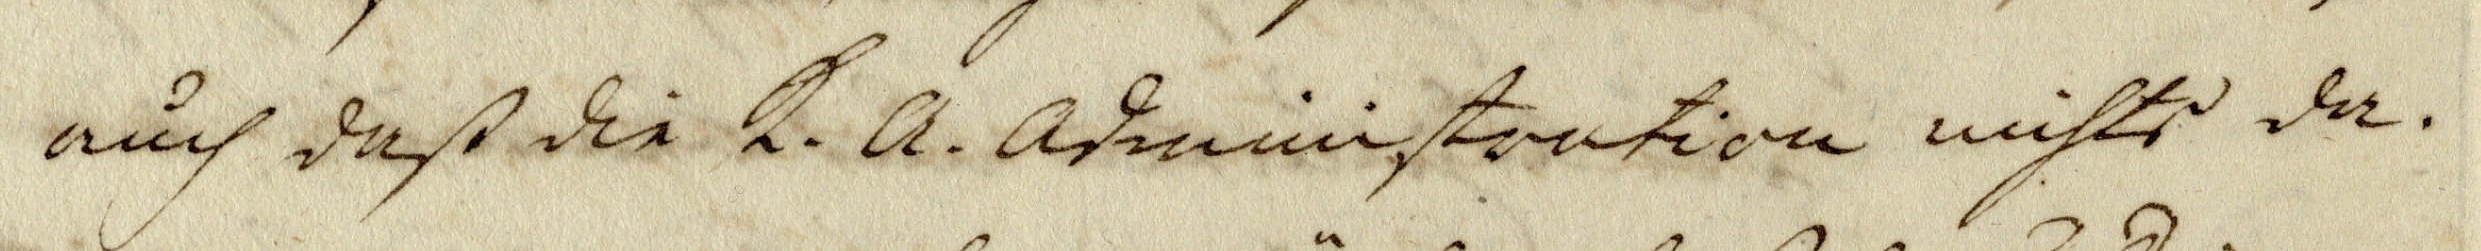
auch daß die K. A. Administration nichts da¬
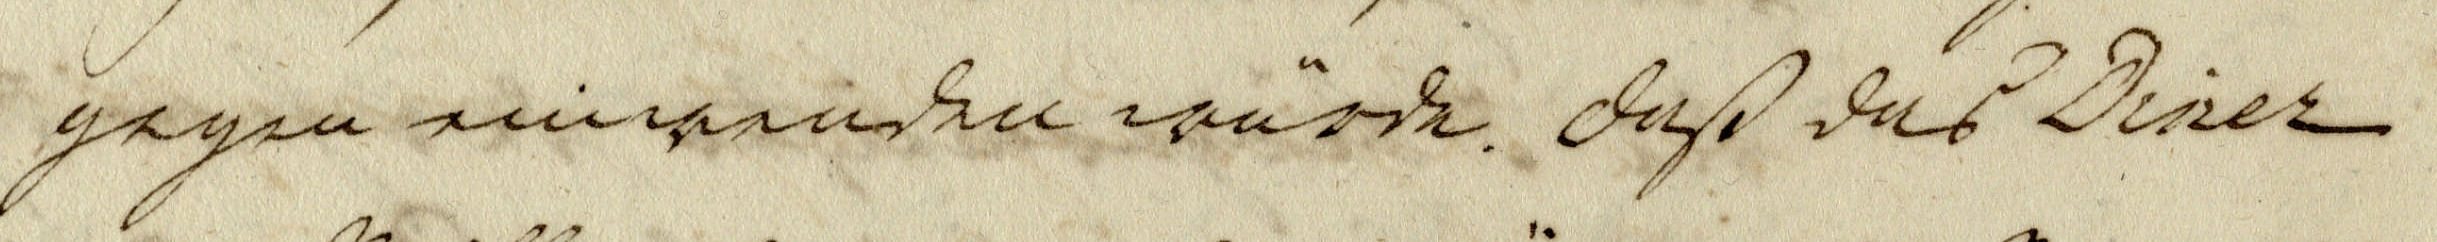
gegen einwenden würde. Daß das Diner
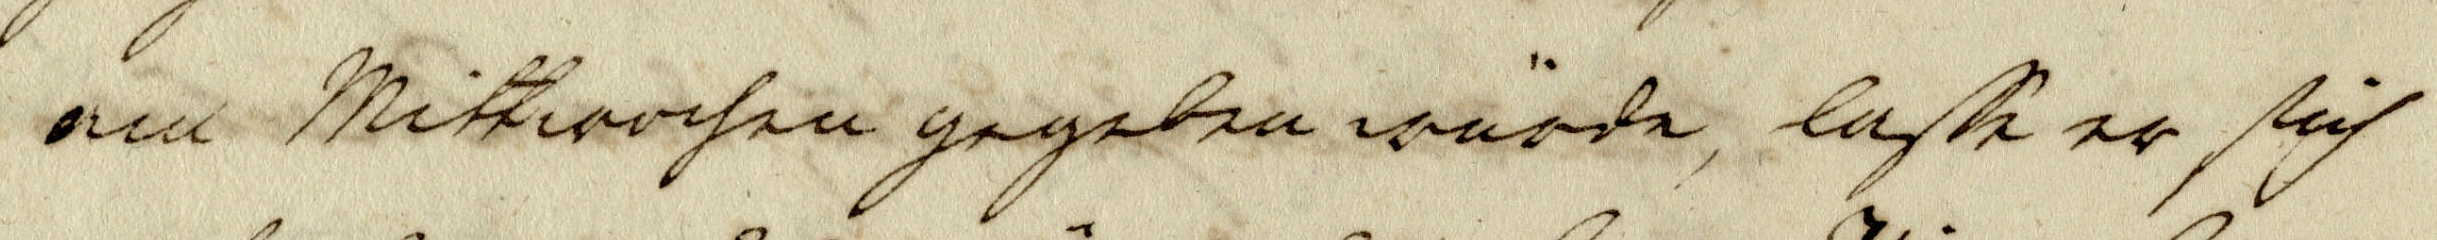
am Mittwochen gegeben würde, lasse er sich
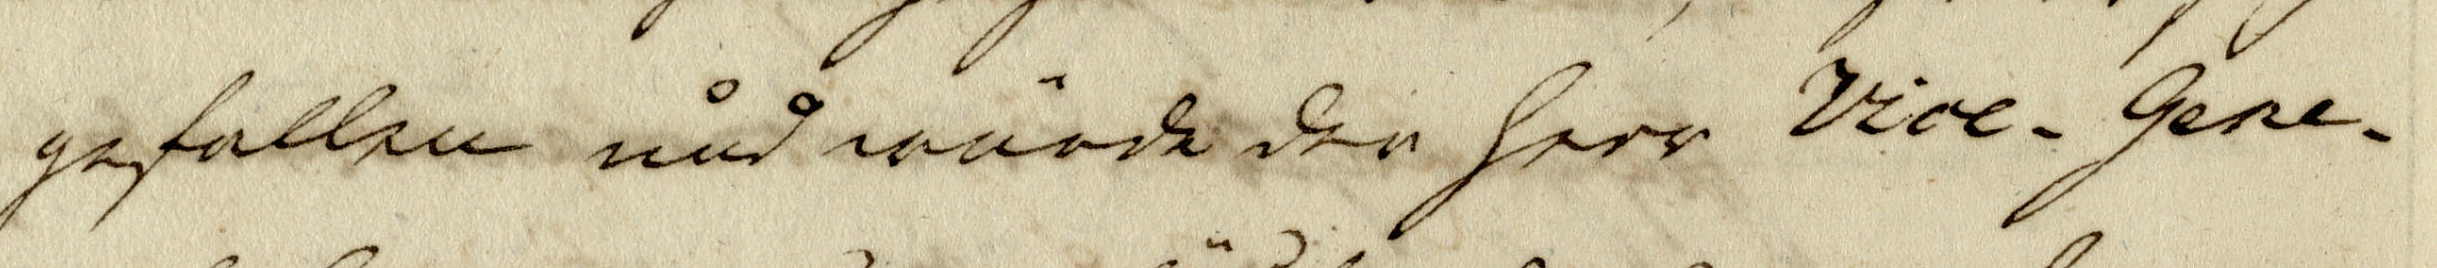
gefallen und würde der Herr Vice- Gene¬
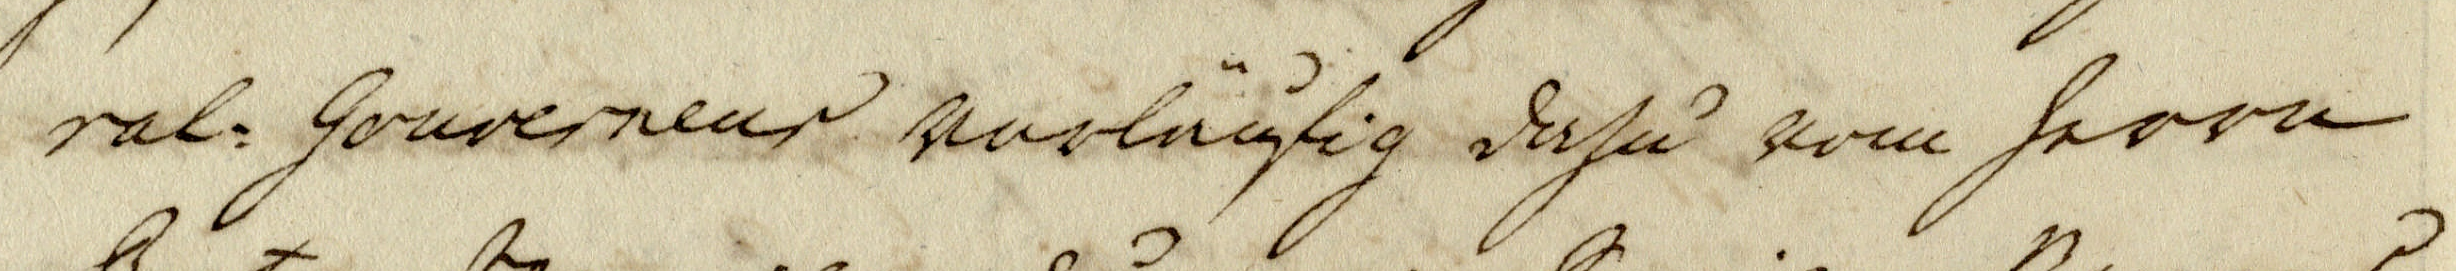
ral Gouverneur vorläufig dazu vom Herrn
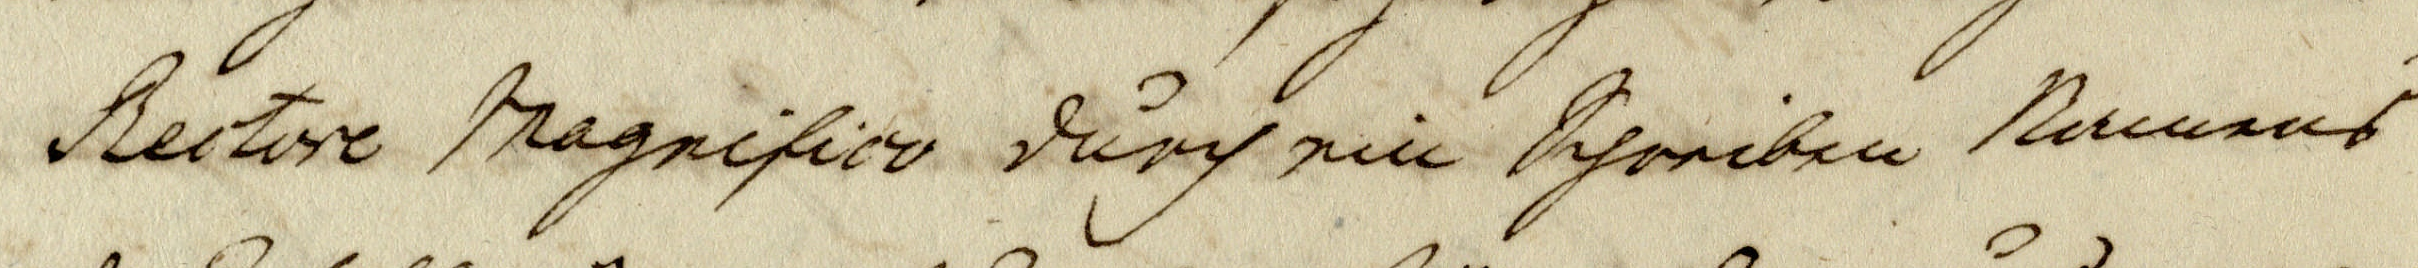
Rectore Magnifico durch ein Schreiben Namens
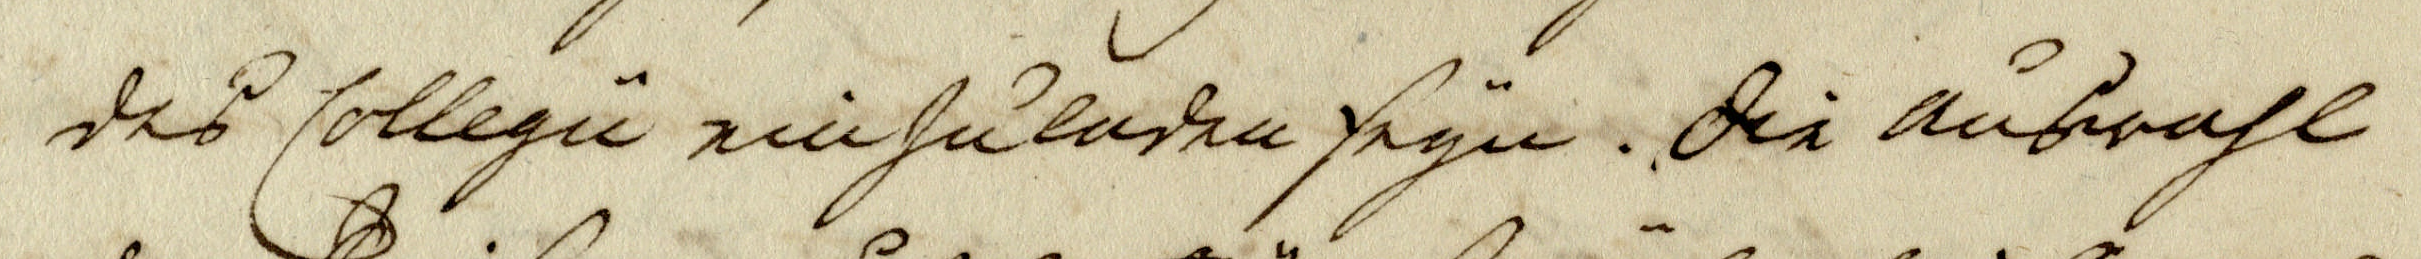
des Collegii einzuladen seÿn. Die Auswahl
